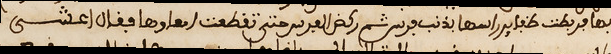بها فربطت ظفائر راسها بذنب فرس ثم ركض الفرس حتى تقطعت امعاوها فقال اعشى
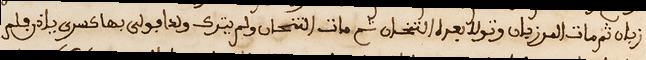زبان ثم مات المرزبان و تولى بعده التخان ثم مات التخان و لم يترك ولدا فولى بها كسرى ياذن فلم
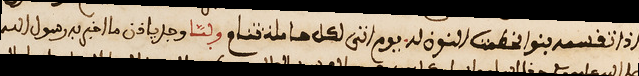اذا تقسمه بنو انحطت النون له يوم اتى لكل حاملة قناع و لمّا وجد ياذن ما اخبره به رسول الله
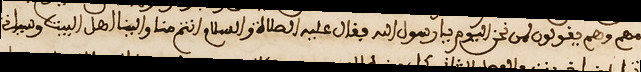مهم و هو يقولون لمن نحن اليوم يا رسول الله فقال عليه الصلاة و السلام انتم منا و الينا اهل البيت و سياته
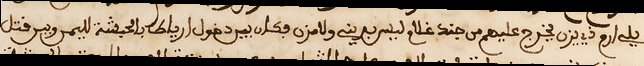بني ادم ذي يذن يخرج عليهم من جند غلام ليسر به بني ولامذن فكان بين دخول ارياطا بالحبشة لليمن قتل
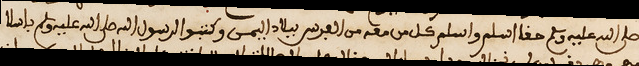صلى الله عليه و سلم حقا اسلم كل من معه من الفرس ببلاد اليمن و كتبو الرسوا لرسول الله صلى الله عليه و سلم باسلا
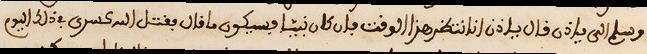و سلم الى ياذن قال ياذن انه انتظر هذا الوقت فان كان نبيا فسيكون ما قال فقتل الله كسرى في ذلك اليوم
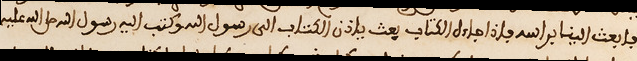فابعث الينا براسه فاذا جاءك الكتاب بعث ياذن الكتاب الى رسول الله و كتب اليه رسول الله صلى الله عليه
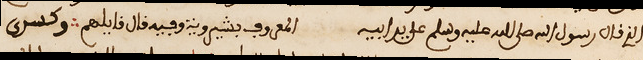الذي قال رسول الله صلى الله عليه و سلم على يد ابيه المعروف بشيروية و فيه قال قايلهم و كسرى
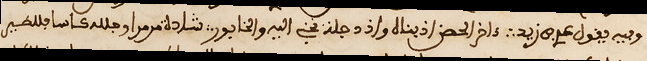و فيه يقول عدى بن زيد ءاخر الحضر اذبناه و اذ دجلة نجبى اليه و الخابور شادة مرمرا و جلله كاسا فللطير
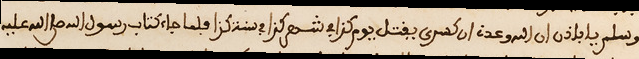و سلم ياباذن ان الله وعدنى ان كسرى يقتل يوم كذا في شهر كذا في سنة كذا فلما جاء كتاب رسول الله صلى الله عليه
